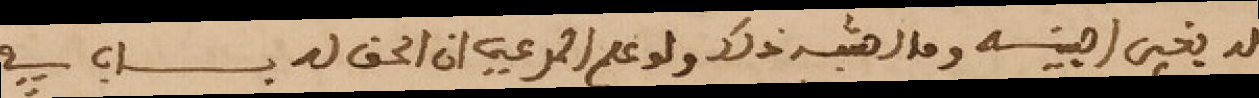له بغير البينة وما اشبه ذلك ولو علم المدعي ان الحق له باب في
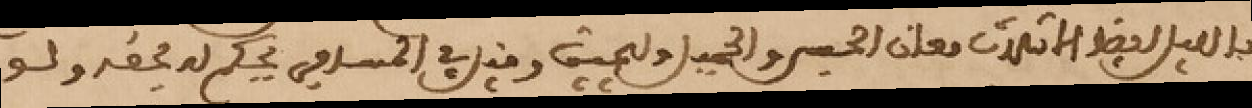بالليل # الا # معان # # # وقيل في المسلمين يحكم له بحقه ولو
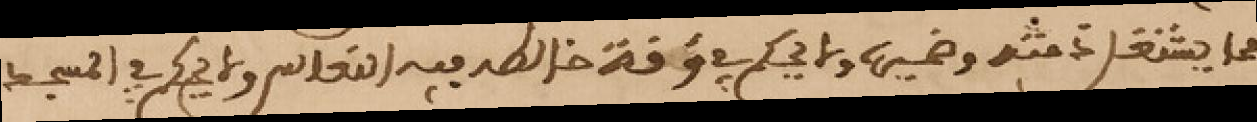مما يشتغل ذمته وضميره ولا يحكم في وقت خالط فيه النعاس ولا يحكم في المسجد
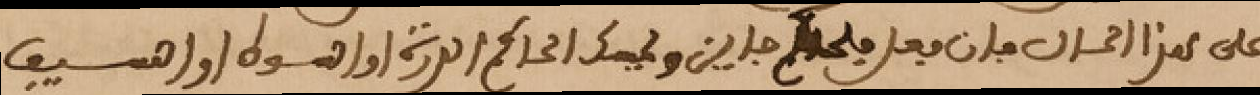على هذا الحال فان فعل فالحكم جايز ويمسك الحاكم # او السوط او السيف
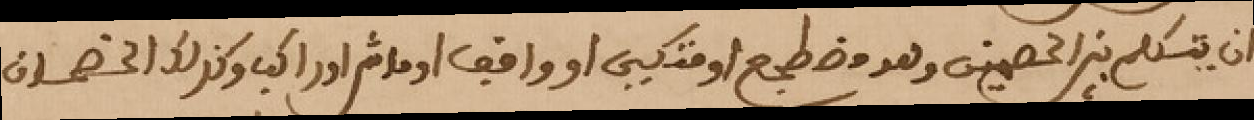ان يتكلم بين الخصمين وهو مضطجع او متكي او واقف او ماش او راكب وكذلك الخصمان
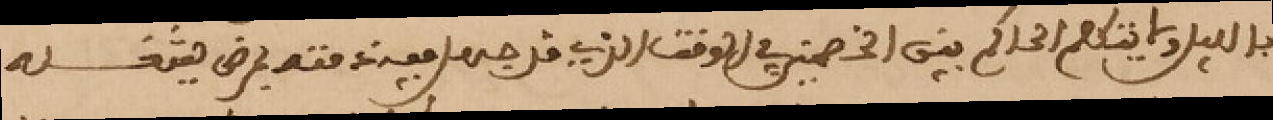بالليل ولا يتكلم الحاكم بين الخصمين في الوقت الذي قد جهل فيه ذمته بمرض يشغله
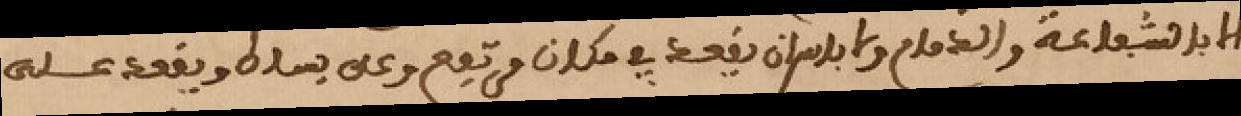الا بالشفاعة والذمام ولا باس ان يقعد في مكان مرتفع وعلى بساط ويقعد على
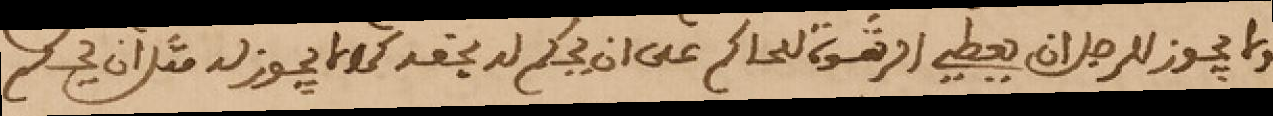ولا يجوز للرجل ان يعطي الرشوة للحاكم على ان يحكم له بحقه كما لا يجوز له مثل ان يحكم
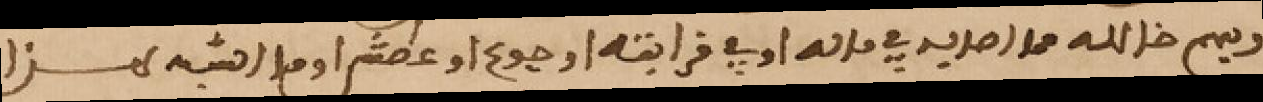ويهم # مما اهديه في ماله او في قرابته او جوع او عطش او ما اشبه هذا
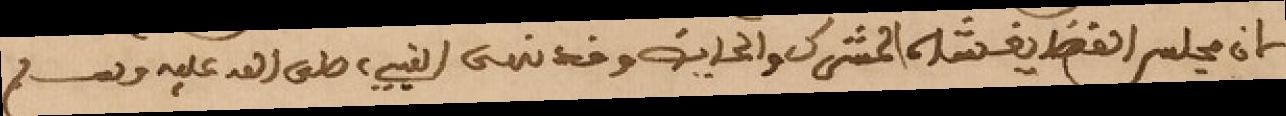لان مجلس القضا يغشاه المشرك و# وقد نهى النبي صلى الله عليه وسلم
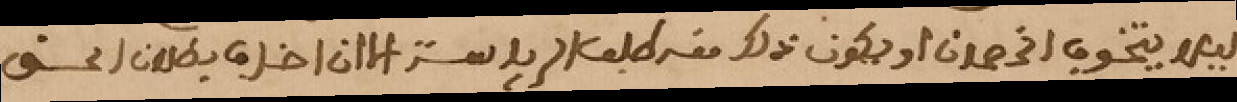ليلا يتخوف الخصمان او يكون ذلك مقر طلب الرياسة الا ان اخاف بطلان الحق
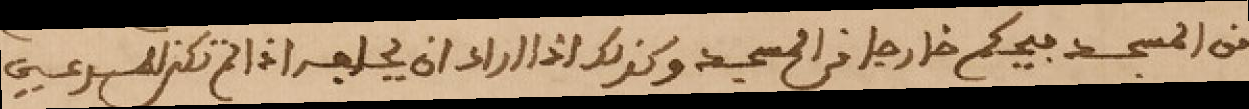من المسجد فيحكم خارجا من المسجد وكذلك اذا اراد ان يحافر اذا لم تكن للمدعي
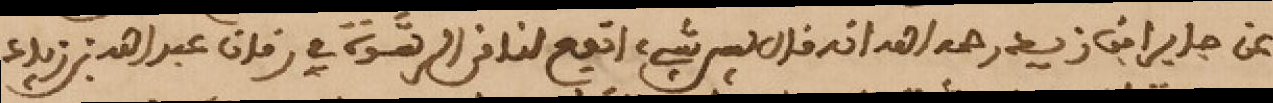عن جابر ابن زيد رحمه الله انه قال ليس شيء انفع لنا من الرشوة في زمان عبد الله بن زيد
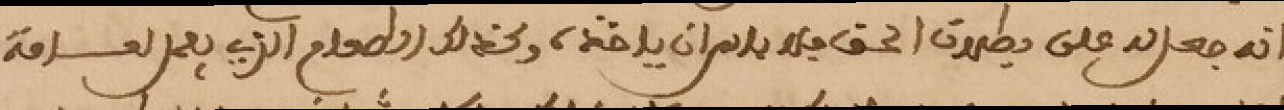انه جعل له على بطلان الحق فلا باس ان ياخذه وكذلك الطعام الذي يعمل لعامة
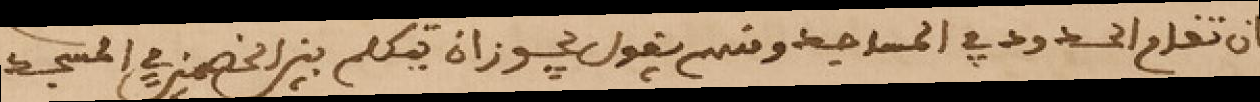ان تقام الحدود في المساجد ومنهم يقول يجوز ان يتكلم بين الخصمين في المسجد
